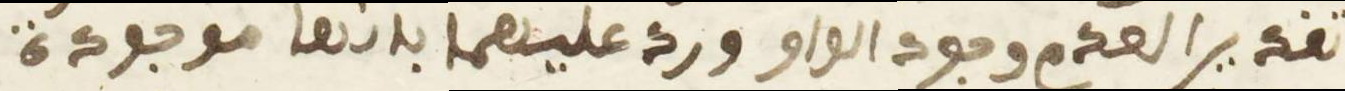تقدير العدم وجود الواو ورد عليهما بانها موجودة
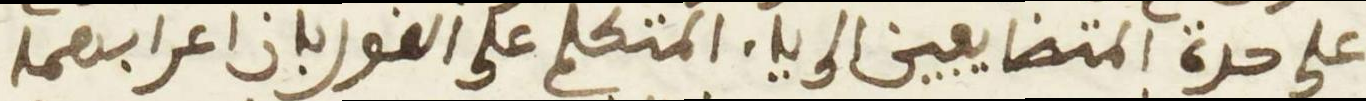على حرة المتضايفين الى ياء المتكلم على القول بان اعرابهما
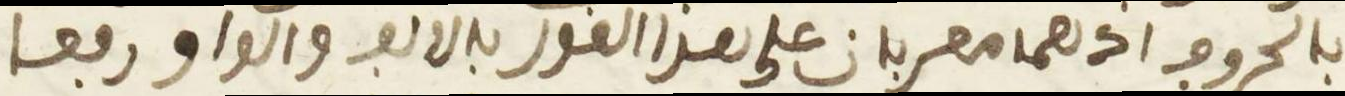بالحروف اذ هما معربان على هذا القول بالالف والواو ورفعا
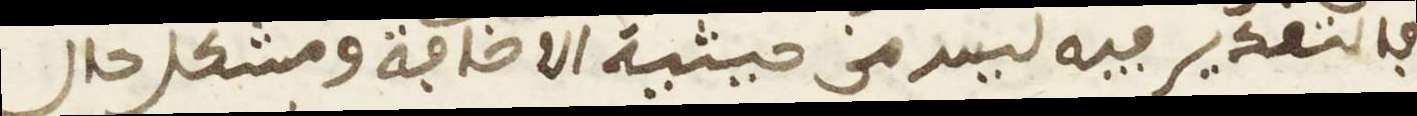فالتقدير فيه ليس من حيثية الاضافة و مشكل حال
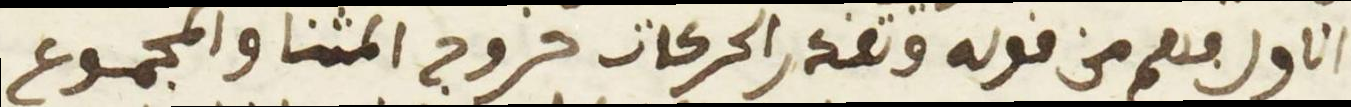الاول فهم من قوله وتقدر الحركات خروج المثنا والمجموع
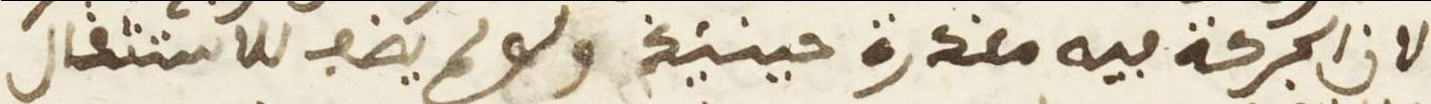لان الحركة فيه مقدرة حينئذ ولو لم يضف للاستثقال
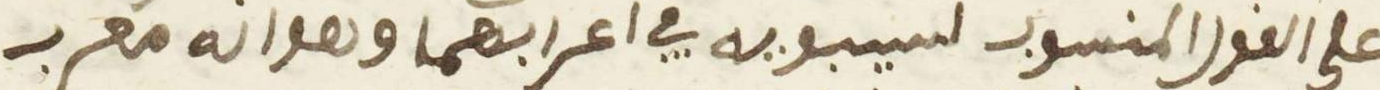على القول المنسوب لسيبويه في اعرابهما وهو انه معرب
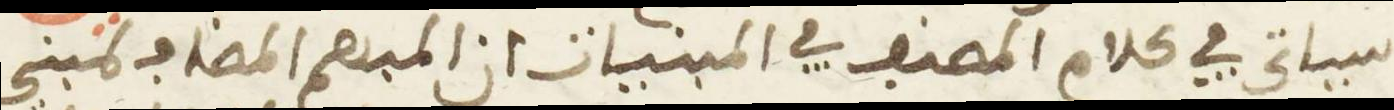سياتي في كلام المصنف في المبنيات ان المبهم المضاف لمبني
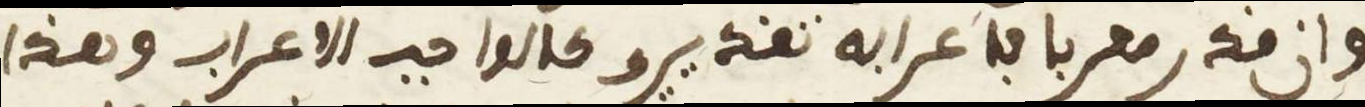و ان قدر معربا فاعرابه تقديره كالواجب الاعراب وهذا
